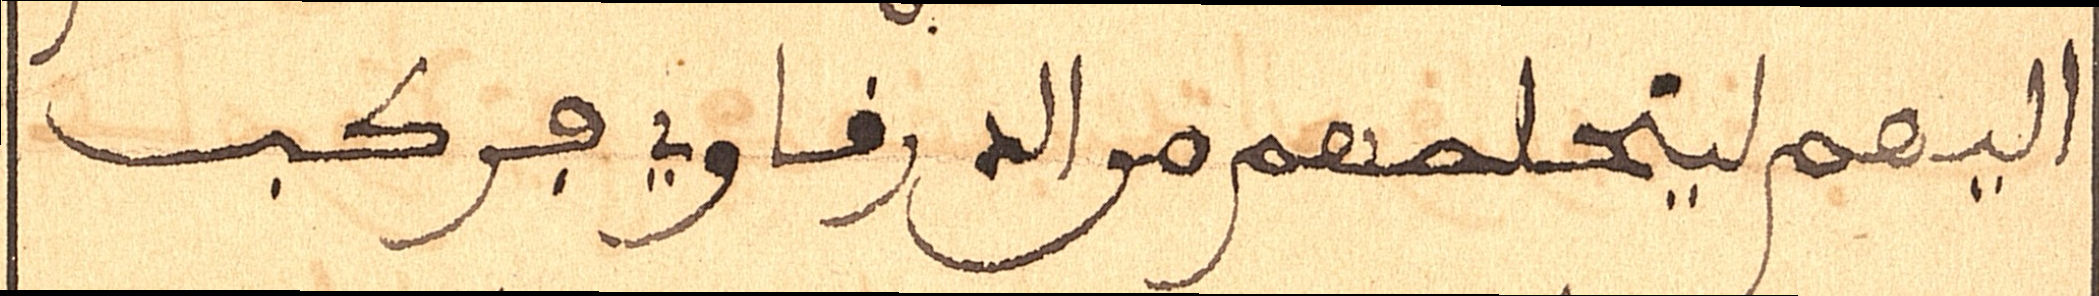اليهم ليخلصهم من الدرقاوي فركب
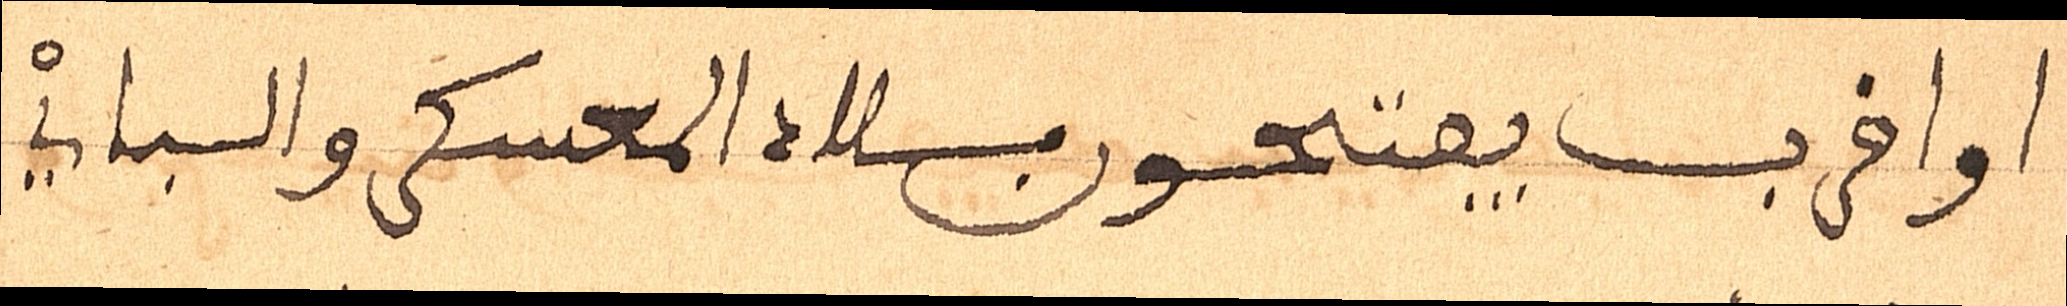اواقرب يفتحون بلاد المعسكر والباي
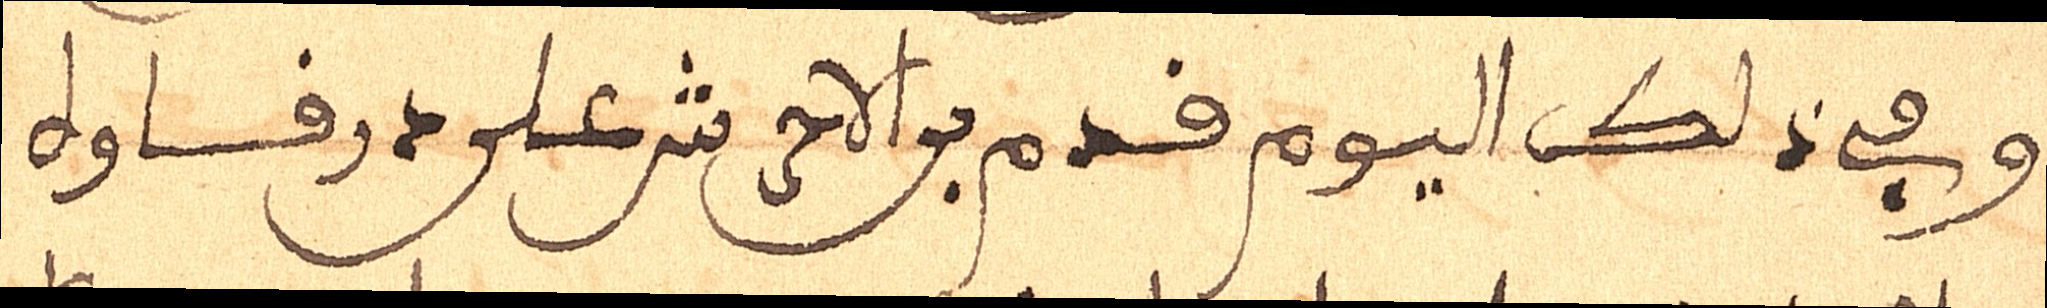وفي ذلك اليوم قدم بن الاحرش على درقاوه
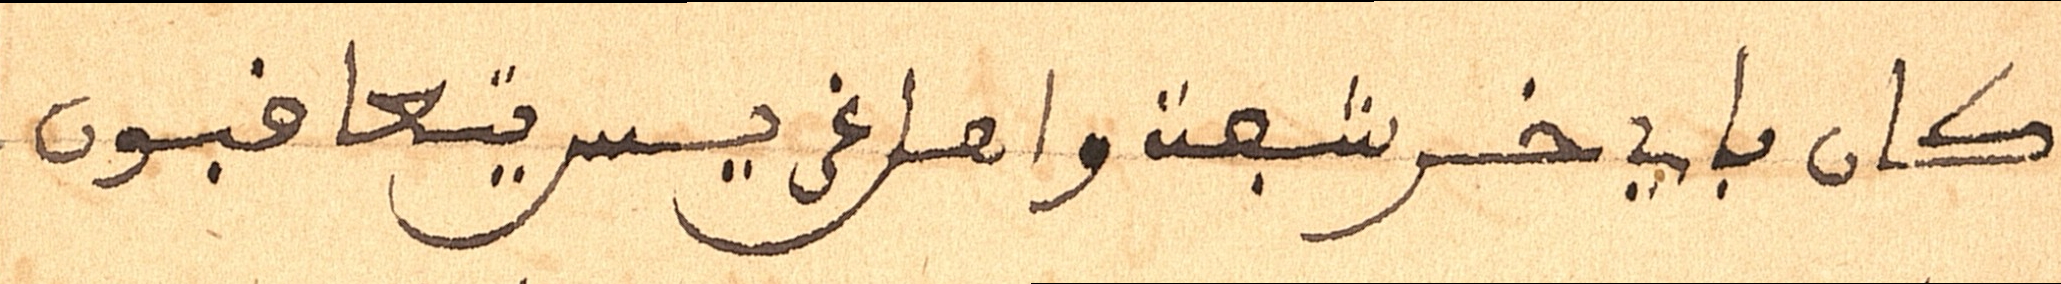كان باي خرشفة واهل غريس يتعاقبون
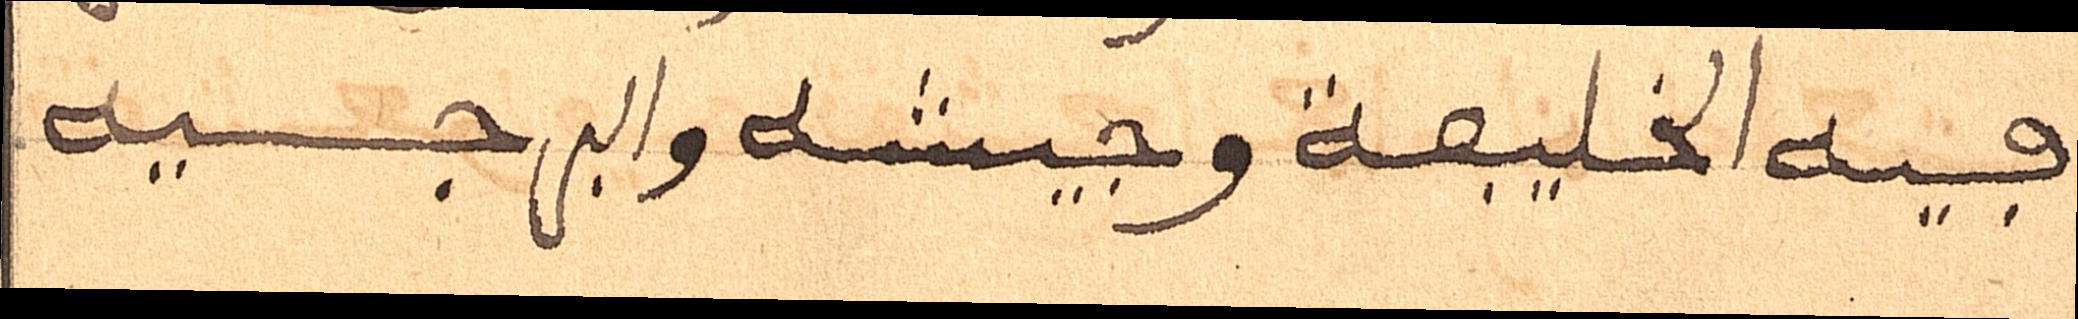فيه الخليفة وجيشه والبرجيه
